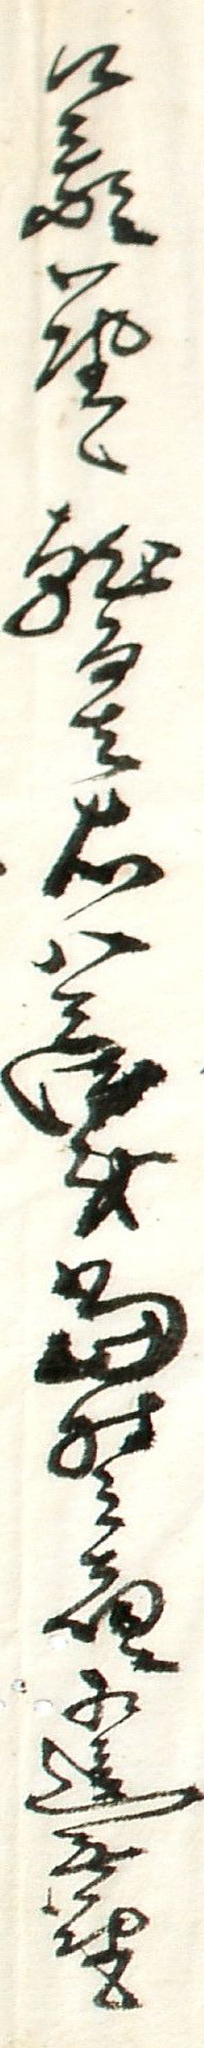候義ニ御坐候就而者右八兵衛義當村之者ニ相違無御坐候
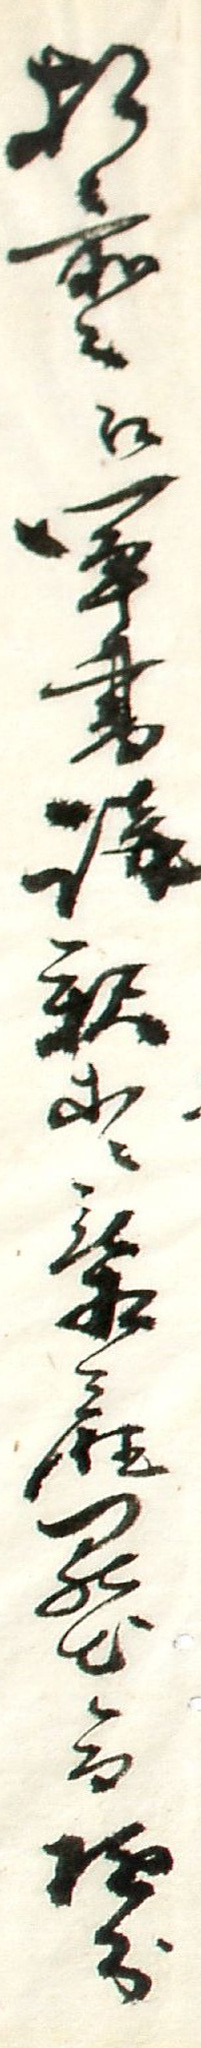折々所々江軍書講釈等ニ被雇罷出候而随分
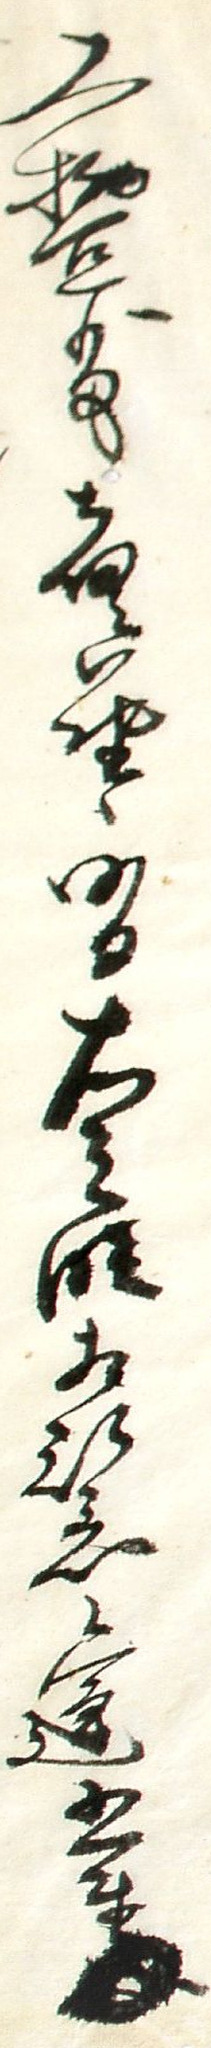人柄宜布者ニ御坐候仍而右之段相行着候運書付
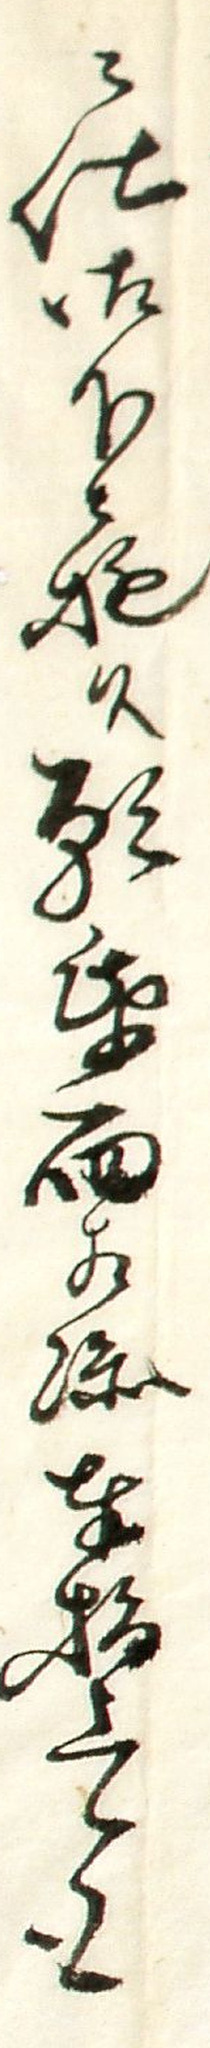ニ仕御下被遊候願帋面相添奉指上候以上

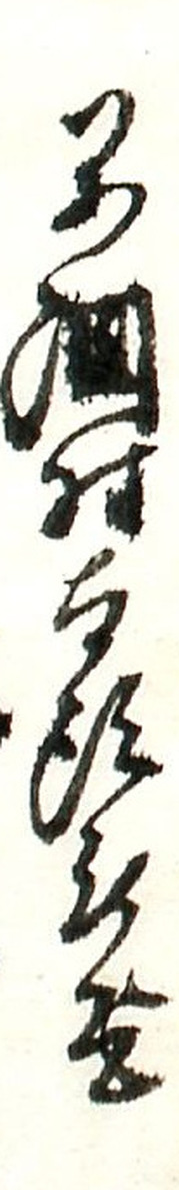早渕村与頭庄屋
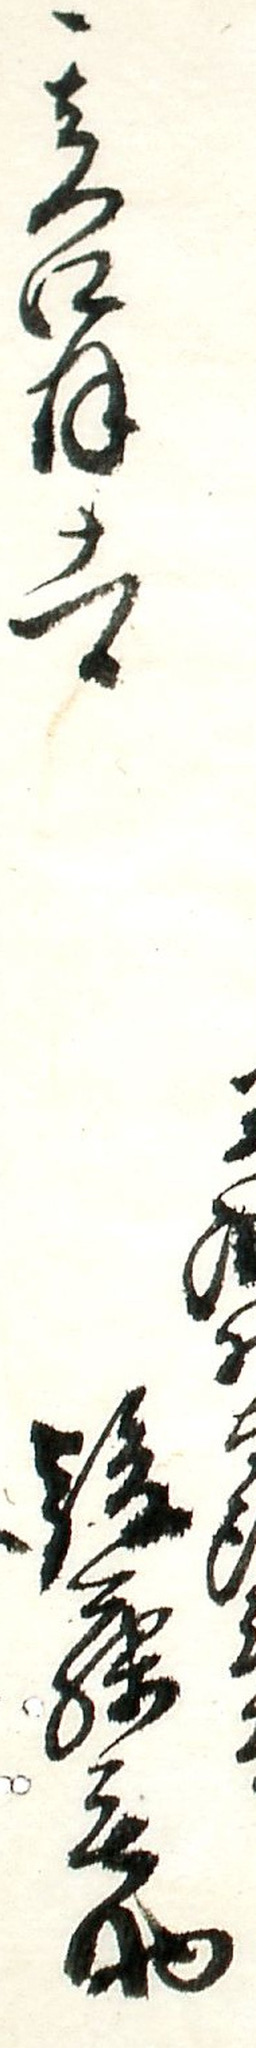亥四月十一日後藤庄助
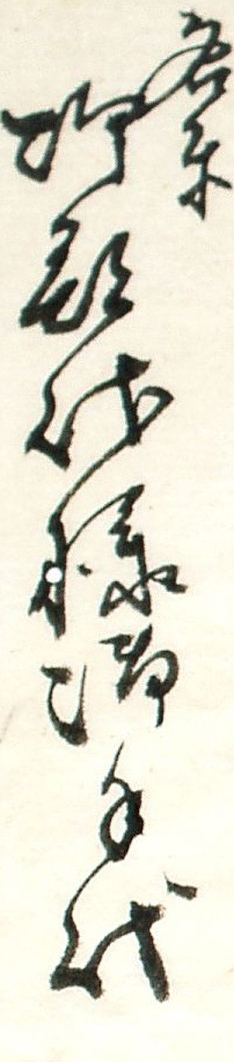御郡代様御手代
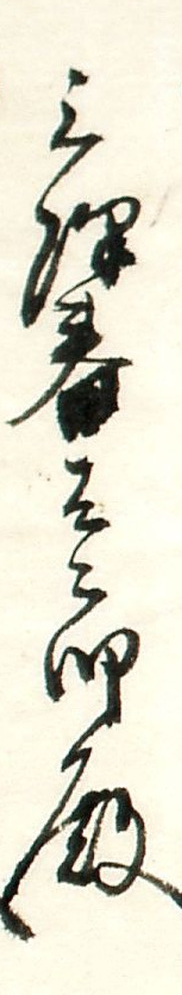三澤春太郎殿
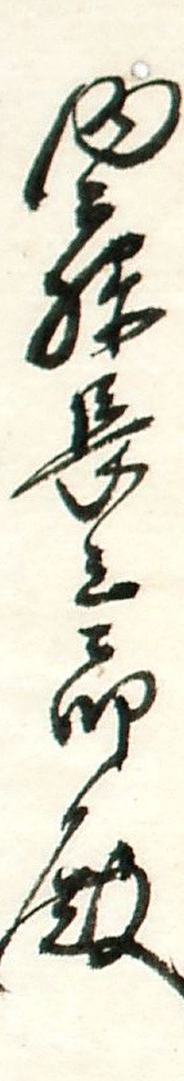内藤長三郎殿
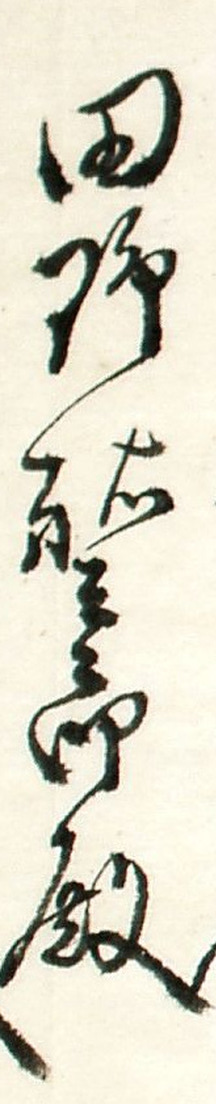田野祐太郎殿
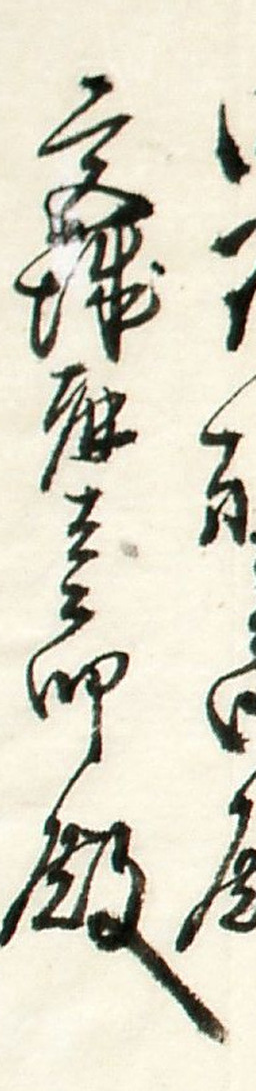宮城麻太郎殿

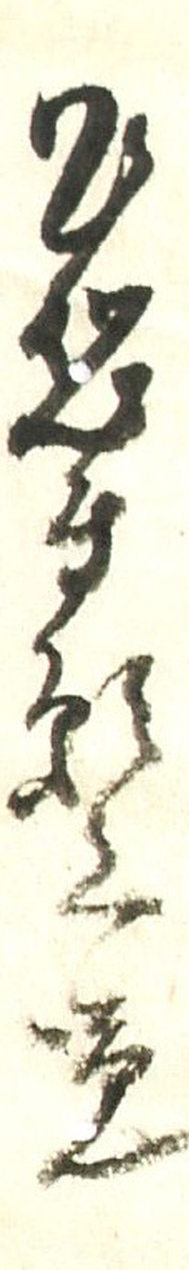乍恐奉願上覚
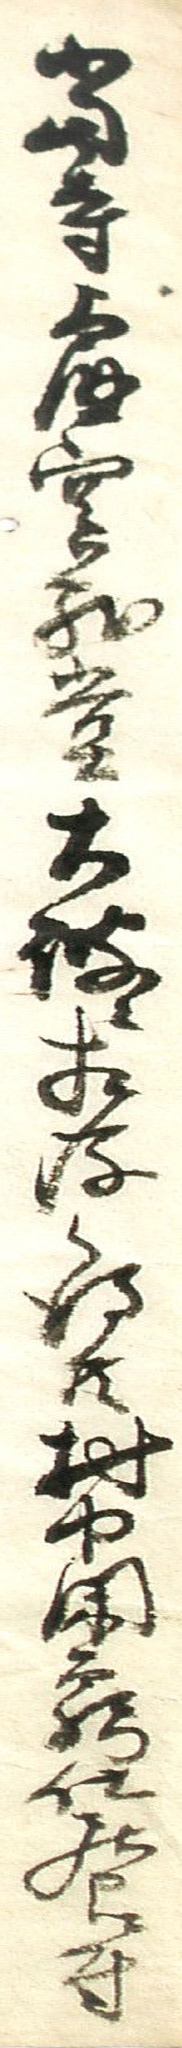當寺虚空蔵堂大破ニ相及候得共村中困窮仕申ニ付
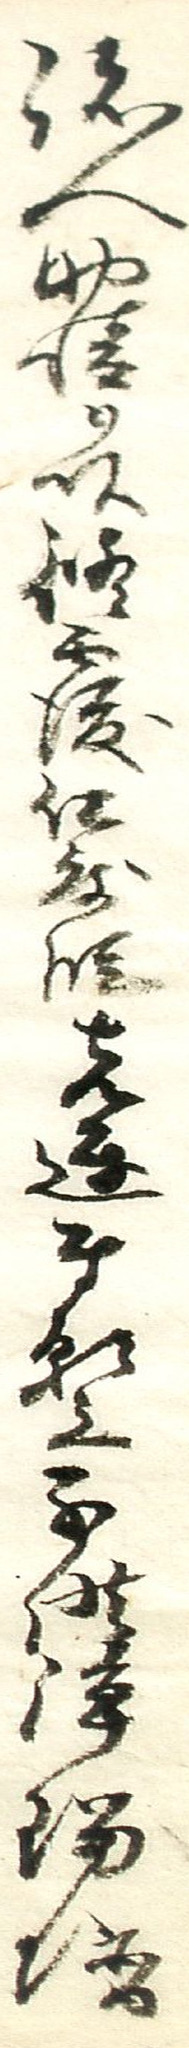諸人助情ヲ以修覆仕度段先達奉願上子供浄瑠璃
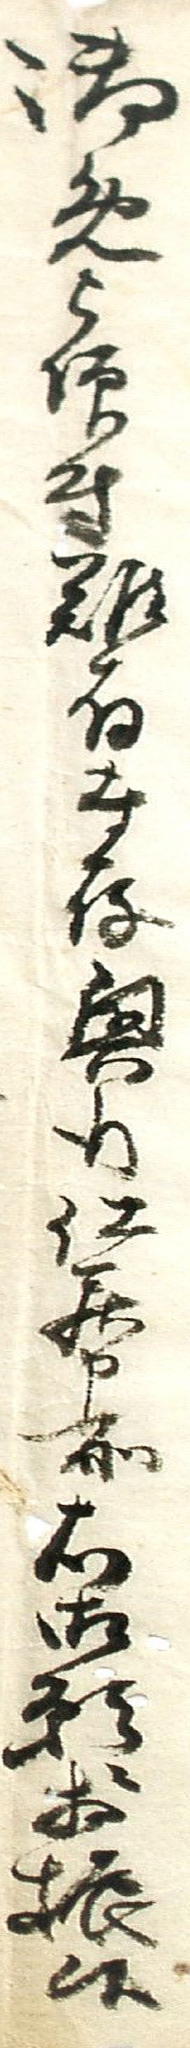御免被仰付難有奉存興行仕居申所右御願ニ相振候
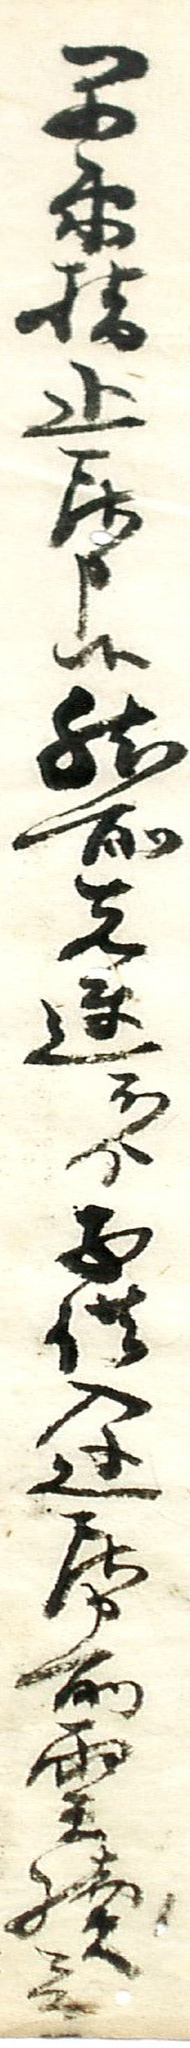早束指止居申候然所先達而ゟ子供入込居申所雨天續ニ而
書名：(早渕村福満寺子ども浄瑠璃願紙面）他
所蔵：鳴門教育大学 Naruto University of Education
